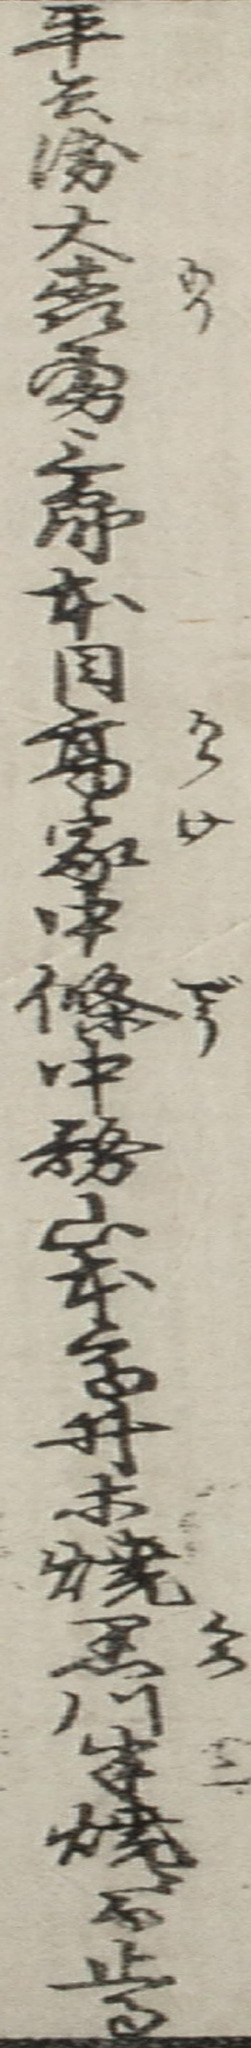平兵衛大森勇三郎本目高家中條中務山本鳥井等焼黒川半焼にて止る
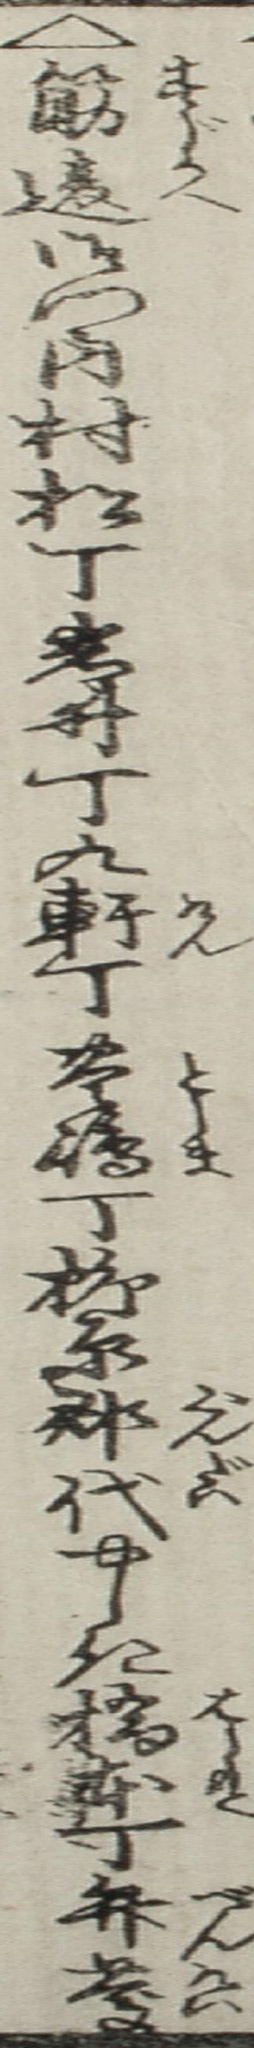△筋違御門内村松丁岩井丁九軒丁豊嶋丁柳原郡代やしき橋本丁弁慶
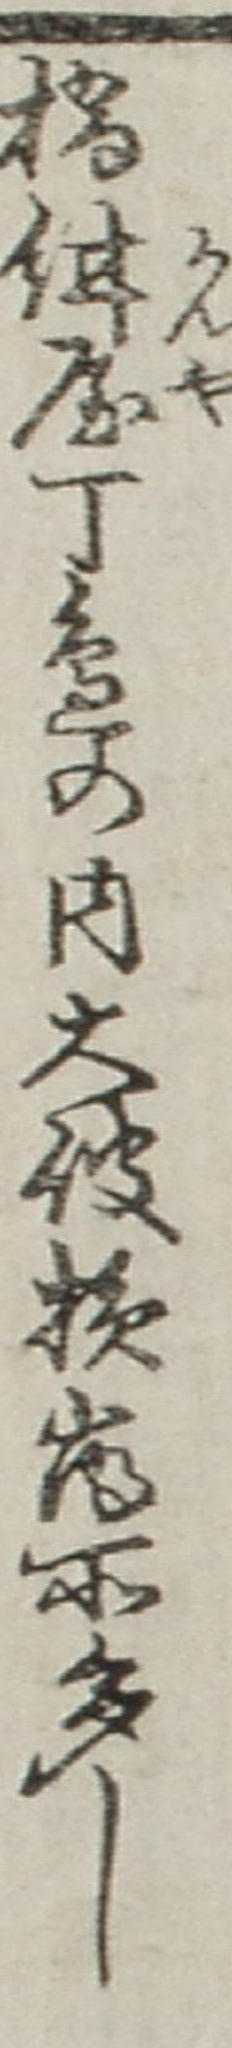橋紺屋丁辺の内大破損崩所多し
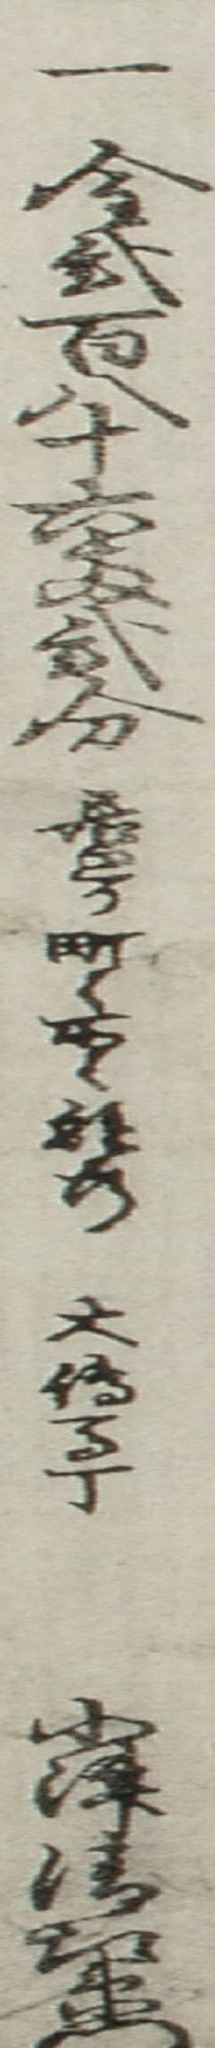一金弐百八十六両弐分居廻り町々所々施行大伝馬丁小津清左衛門
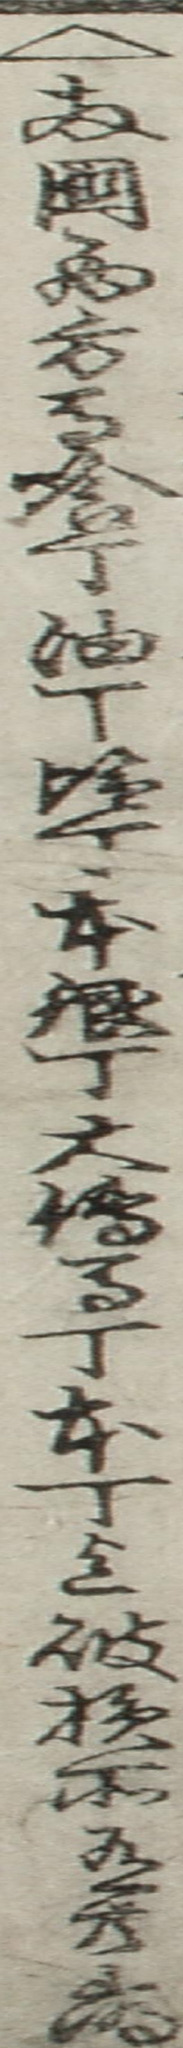△両国西方馬喰丁油丁塩丁本銀丁大伝馬丁本丁迄破損所有共崩

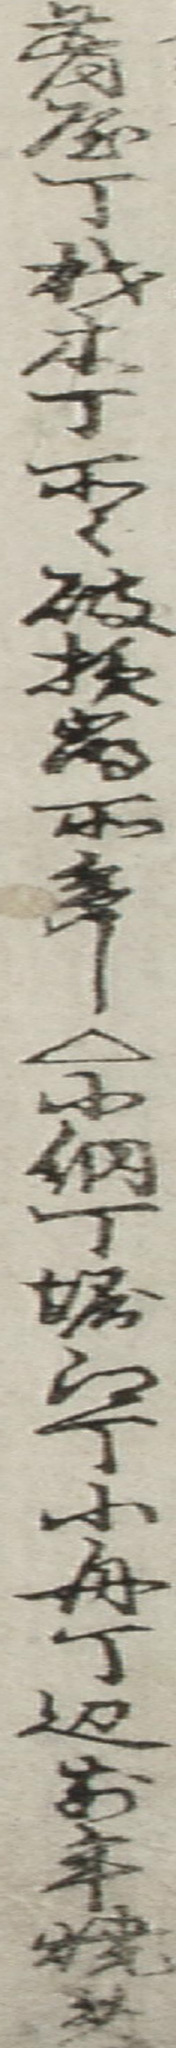葺屋丁材木丁所々破損崩所多し△小網丁堀江丁小舟丁辺前年焼失
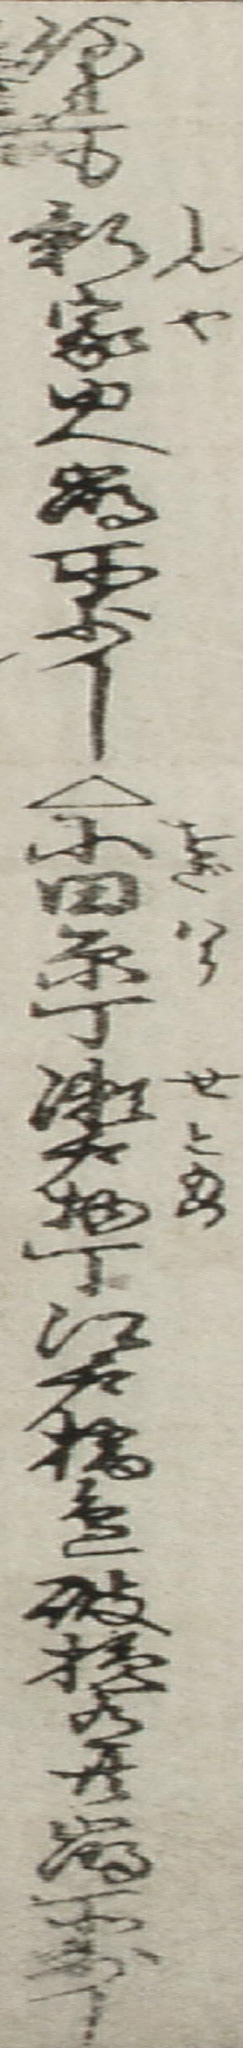何れも新家ゆへ崩所少し△小田原丁瀬戸物丁江戸橋辺破損有共崩所少し
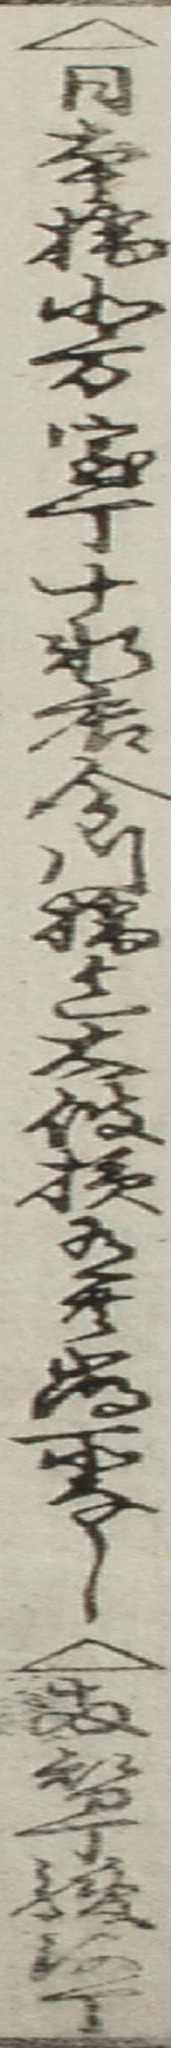△日本橋北方室丁十軒店今川橋迄大破損有共崩所なし△両替丁駿河丁
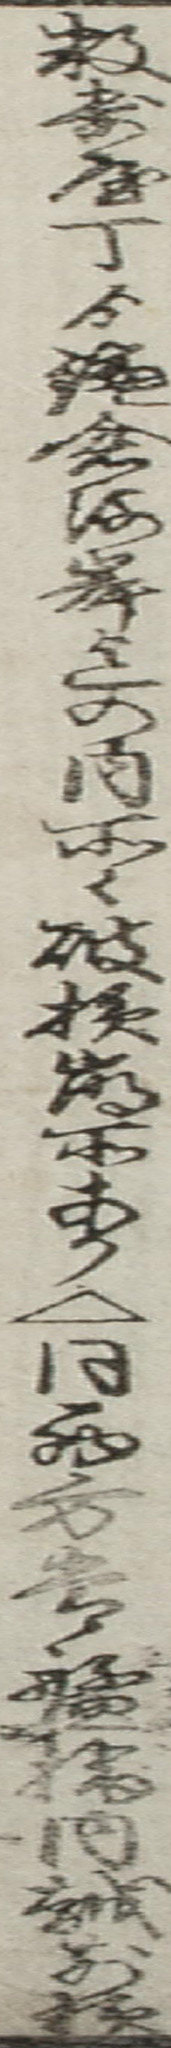数奇屋丁ゟ鎌倉河岸迄の内所々破損崩所あり△同西方常盤橋内越前様
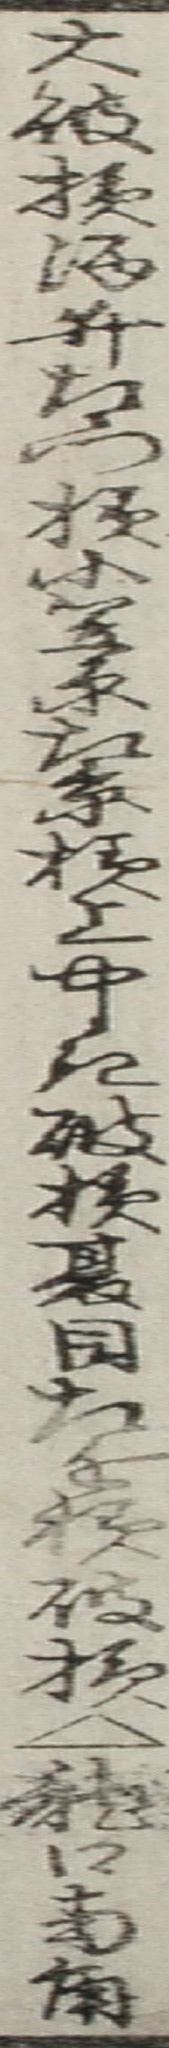大破損酒井左衛門様小笠原左京様上やしき破損夏目左近様破損△龍口南角
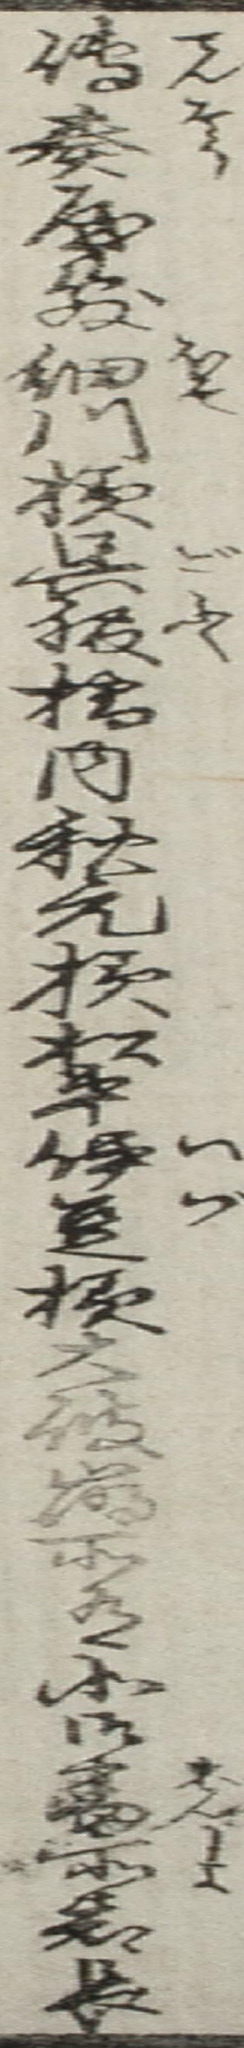伝奏屋敷細川様呉服橋内秋元様松平伊豆様大破崩所有北御番所表長
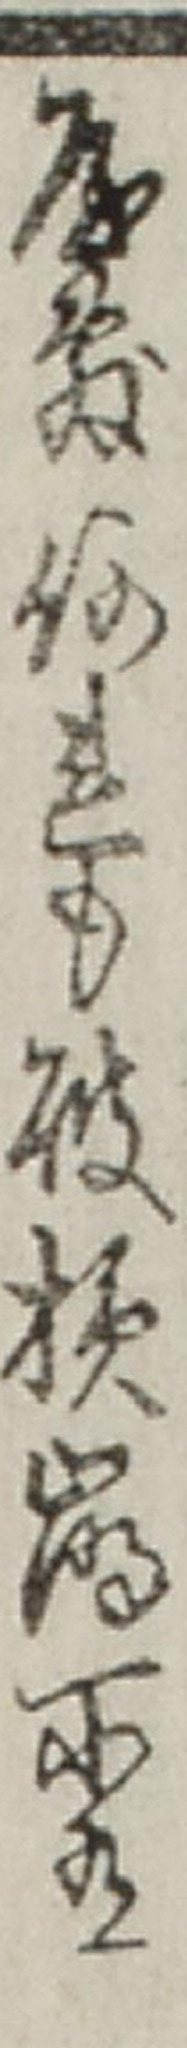屋敷何れも破損崩所有
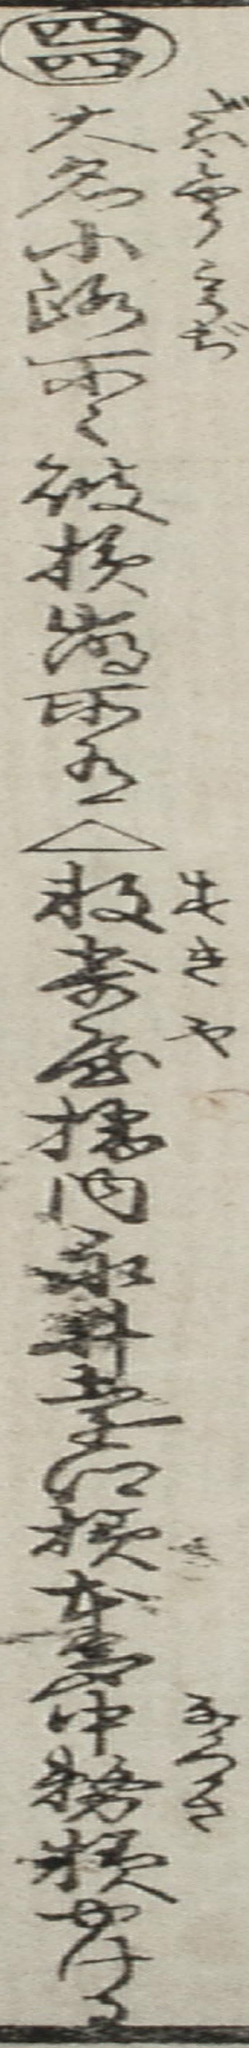大名小路所々破損崩所有△数奇屋橋内永井遠江様本多中務様やける
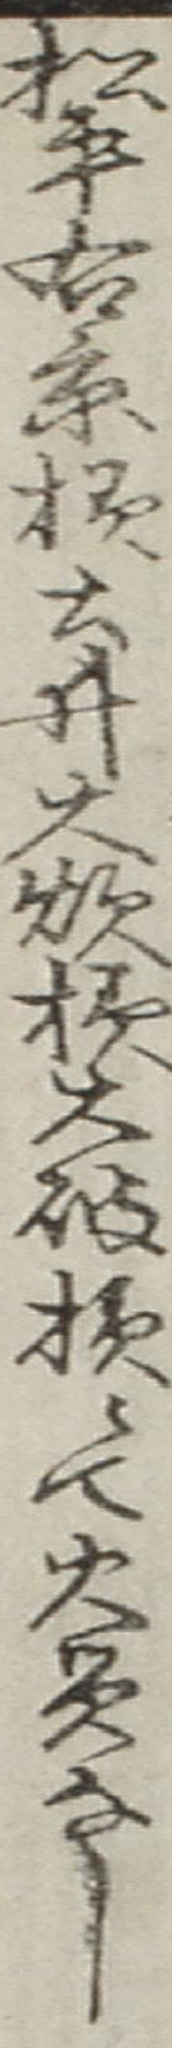松平右京様土井大炊様大破損にて火災なし
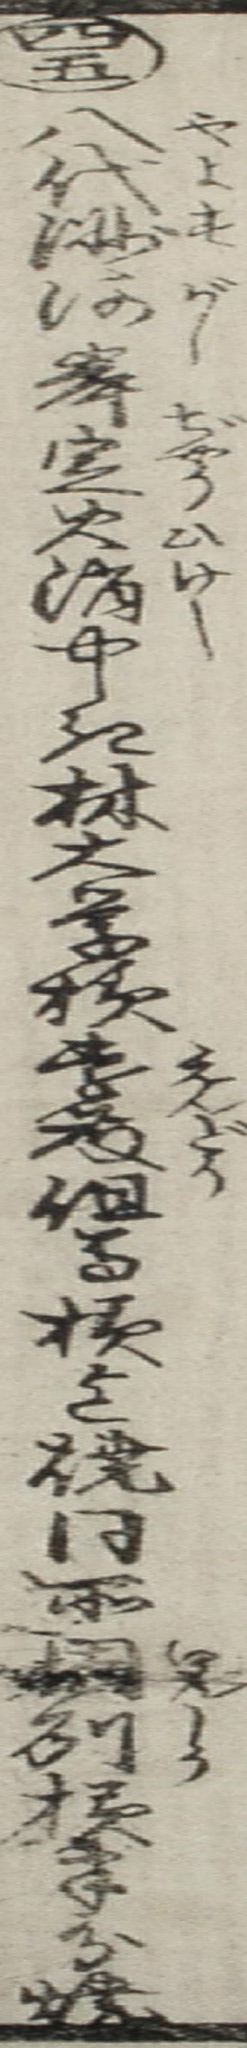八代洲河岸定火消やしき林大学様遠藤但馬様迄焼同所因州様半分焼
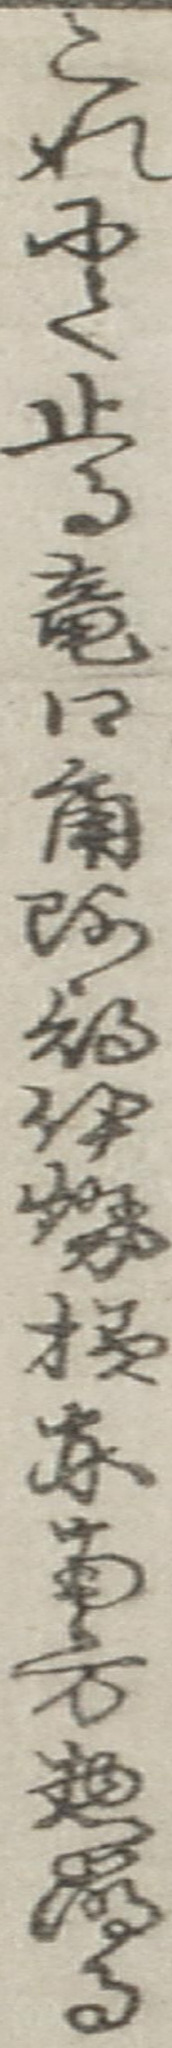これにて止る竜口角阿部伊勢様東南方惣崩る
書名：安政見聞誌　下
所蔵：東京大学地震研究所図書室 Earthquake Research Institute Library, The University of Tokyo, JAPAN
